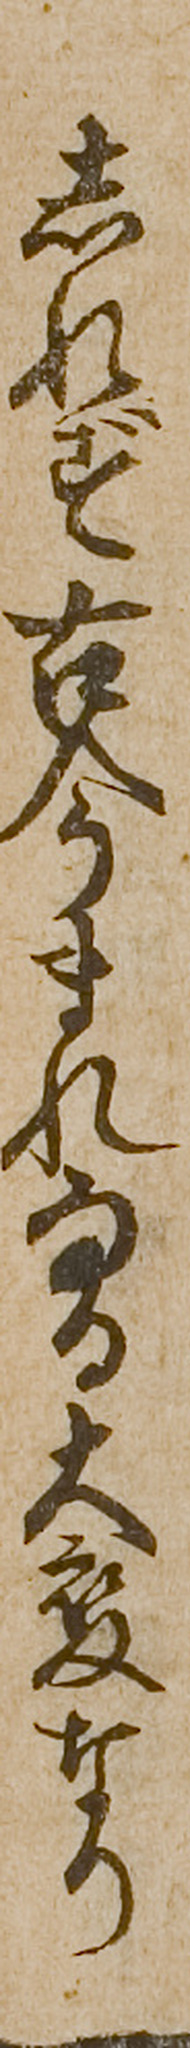しれず古今まれなる大変なり
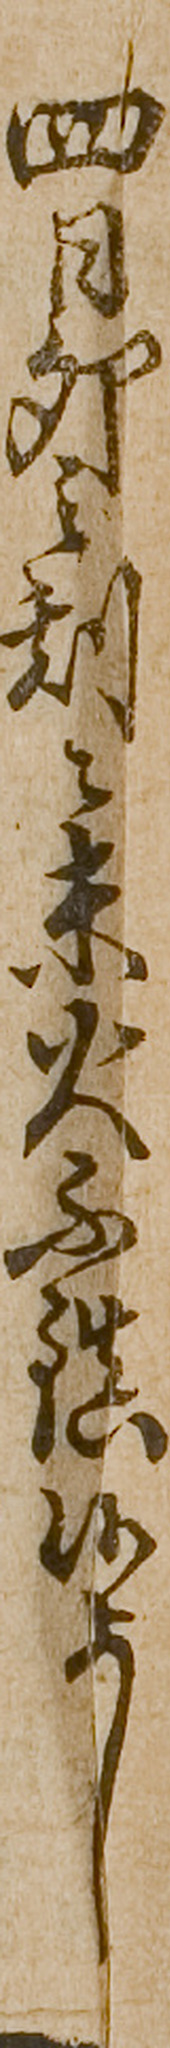四日卯之刻に未火不鎮候よし
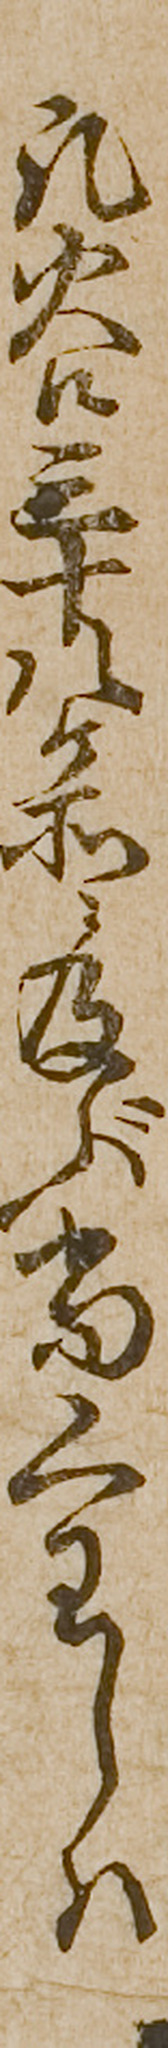凡火口三十八ケ所に及ぶ尚くわしは
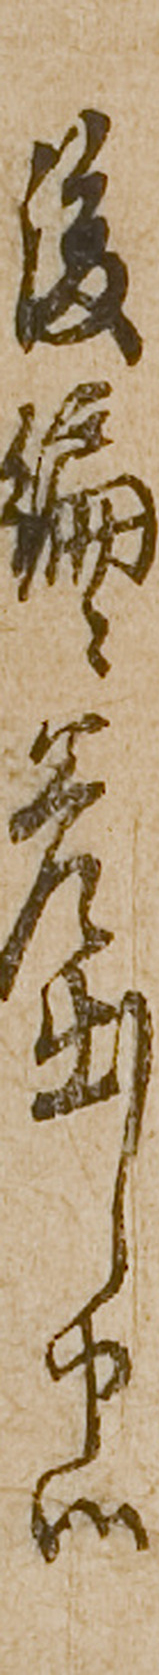後編に差出し申候
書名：[安政地震摺物]
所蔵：東京大学総合図書館 General Library in the University of Tokyo, JAPAN
